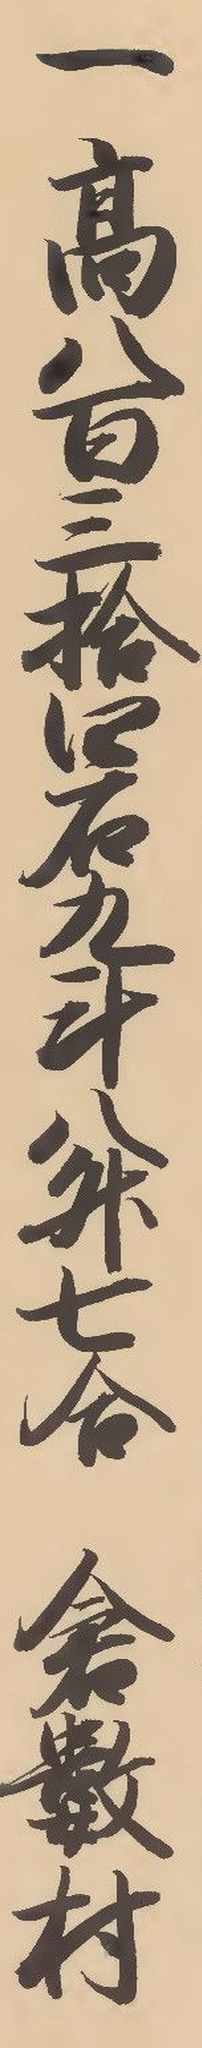一高八百三拾四石九斗八升七合倉数村

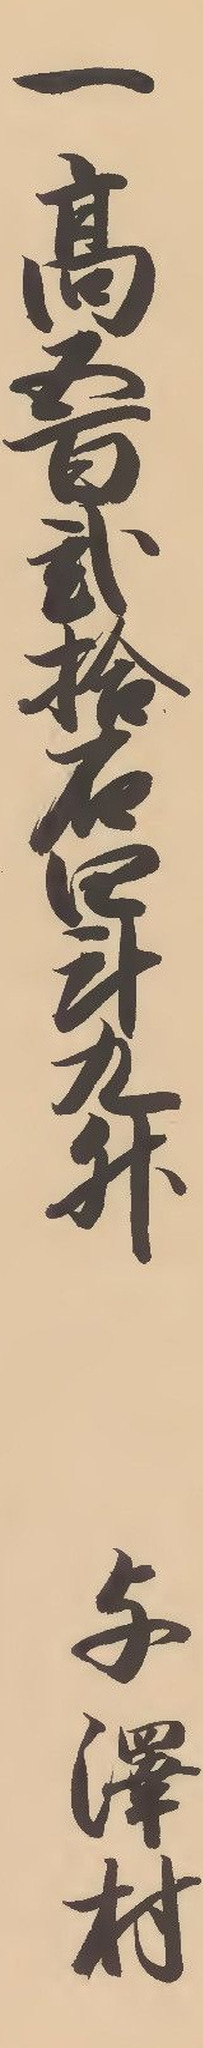一高五百弐拾石四斗九升与沢村
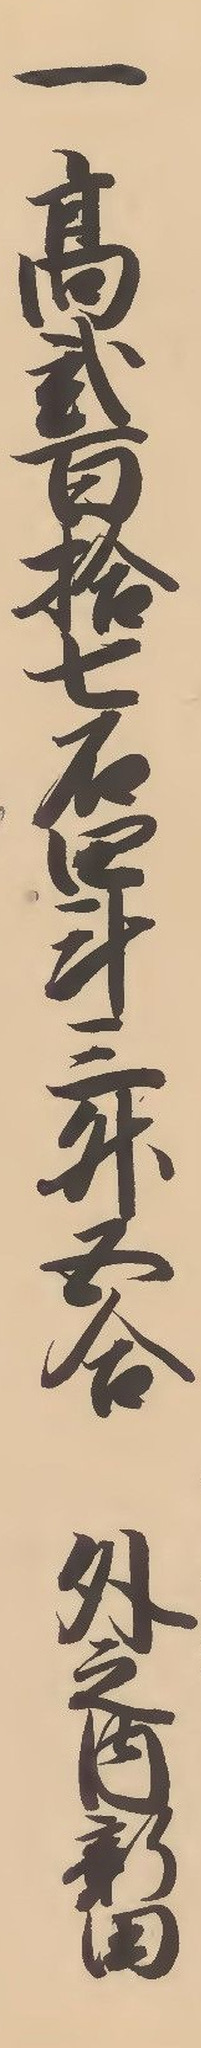一高弐百拾七石四斗三升五合外之内新田
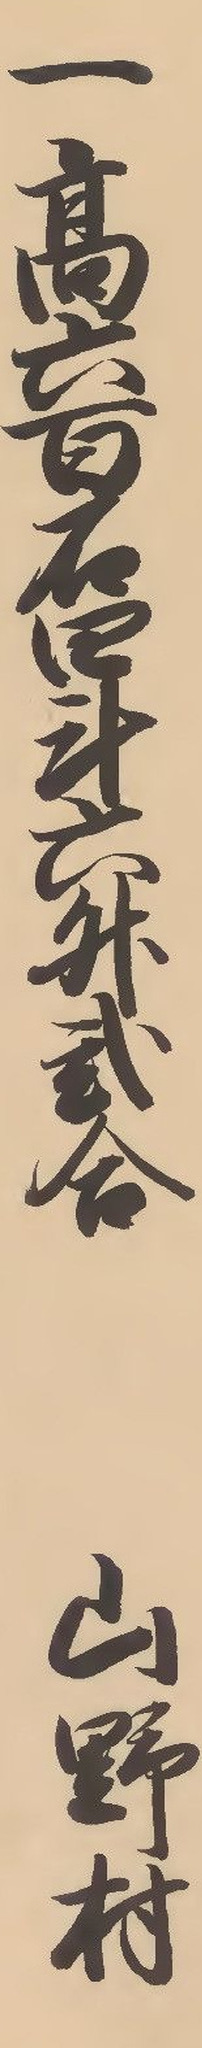一高六百石四斗六升弐合山野村
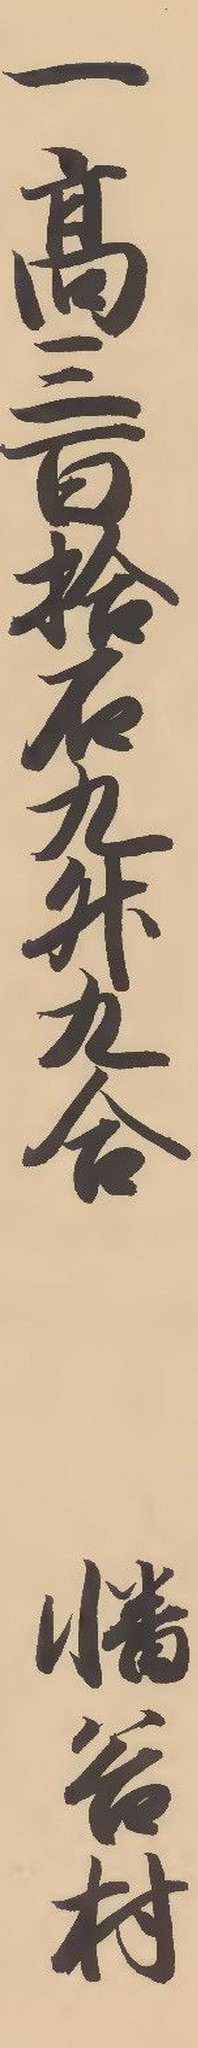一高三百拾石九升九合幡谷村
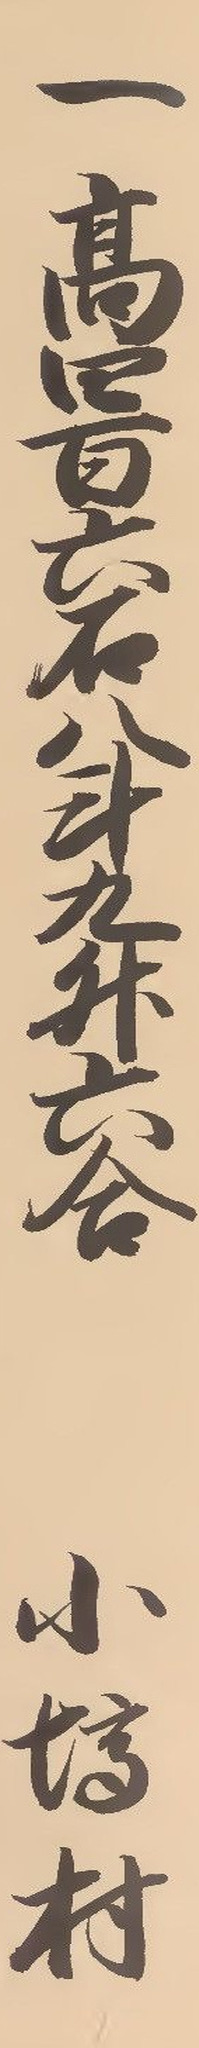一高四百六石八斗九升六合小塙村
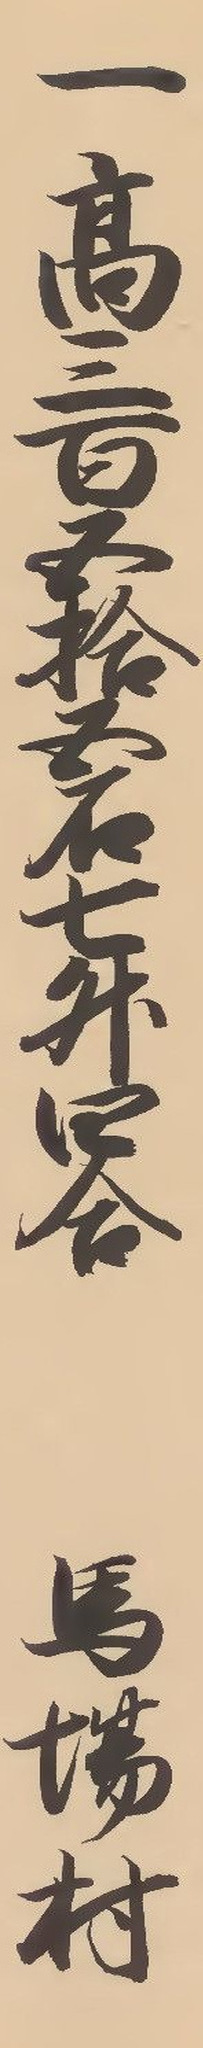一高三百五拾五石七升四合馬場村
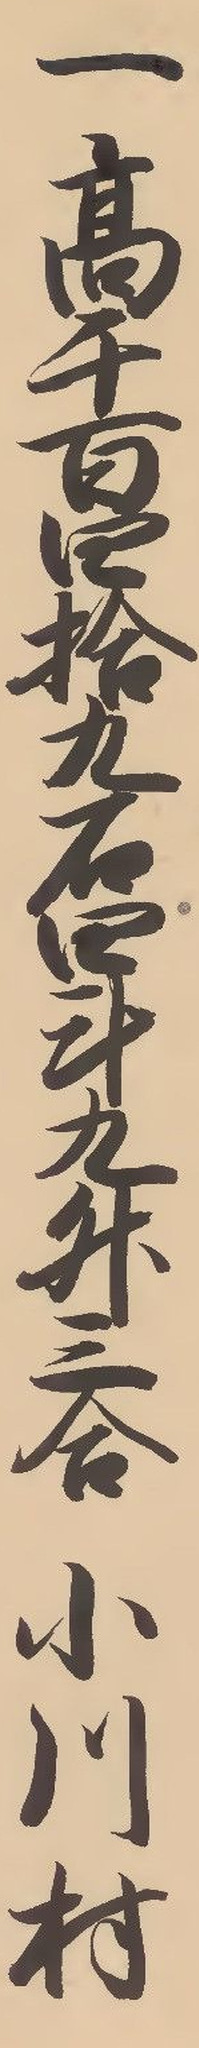一高千百四拾九石四斗九升三合小川村
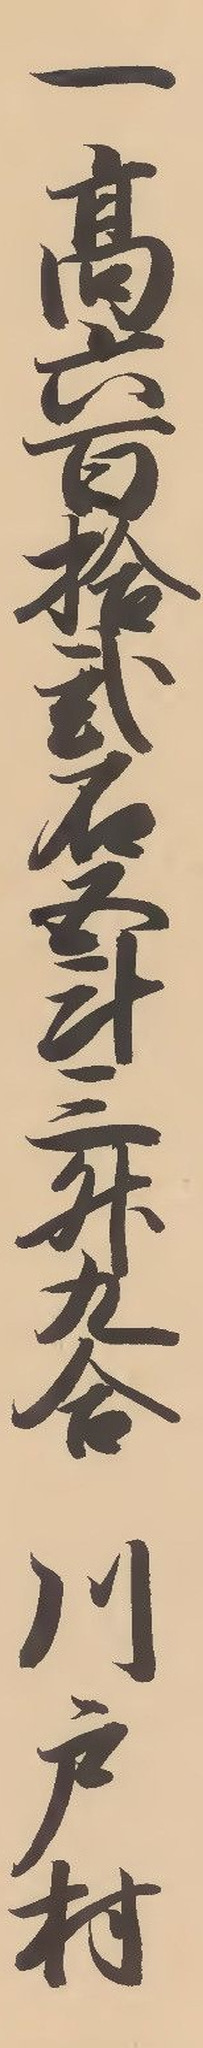一高六百拾弐石五斗三升九合川戸村

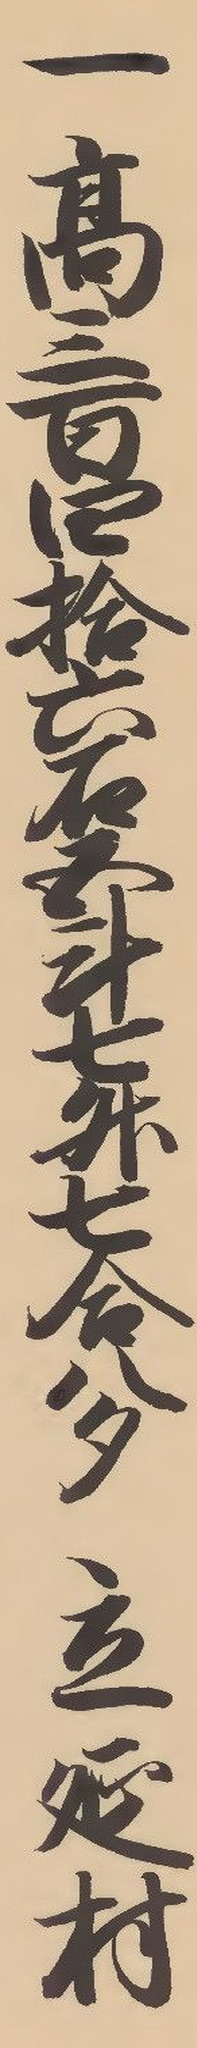一高三百四拾六石五斗七升七合八勺立延村
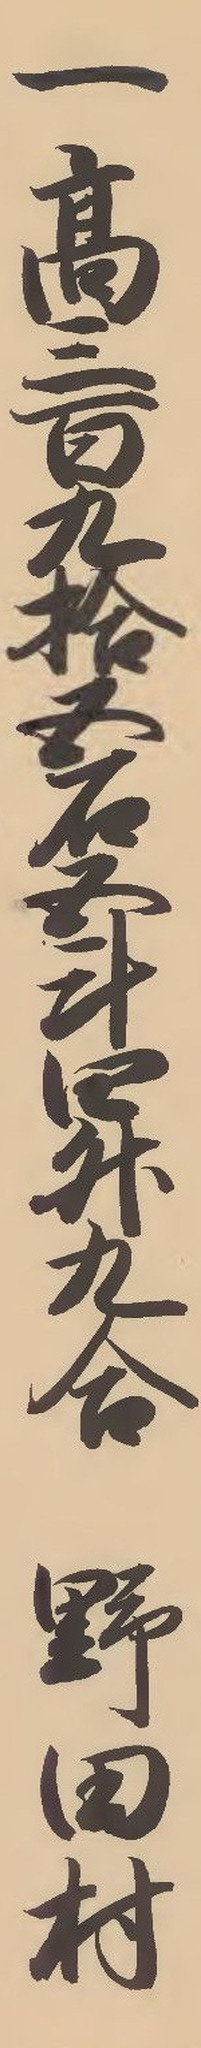一高三百九拾五石五斗四升九合野田村
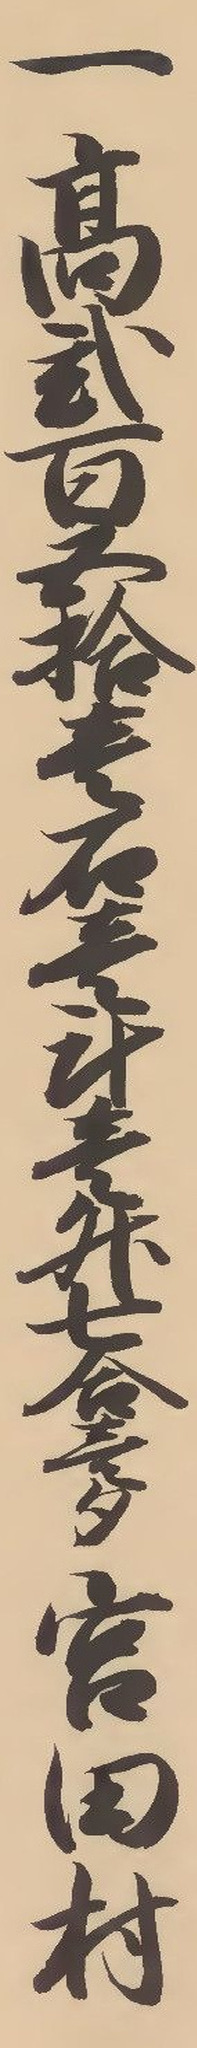一高弐百五拾壱石壱斗壱升七合壱勺宮田村
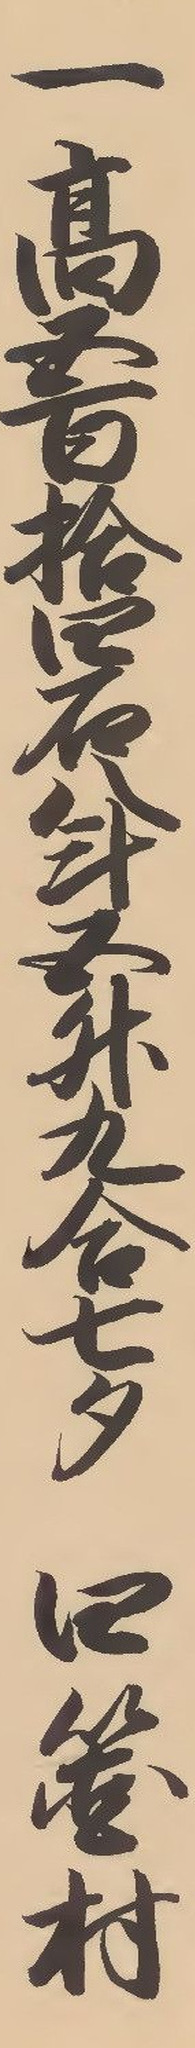一高五百拾四石八斗五升九合七勺四箇村
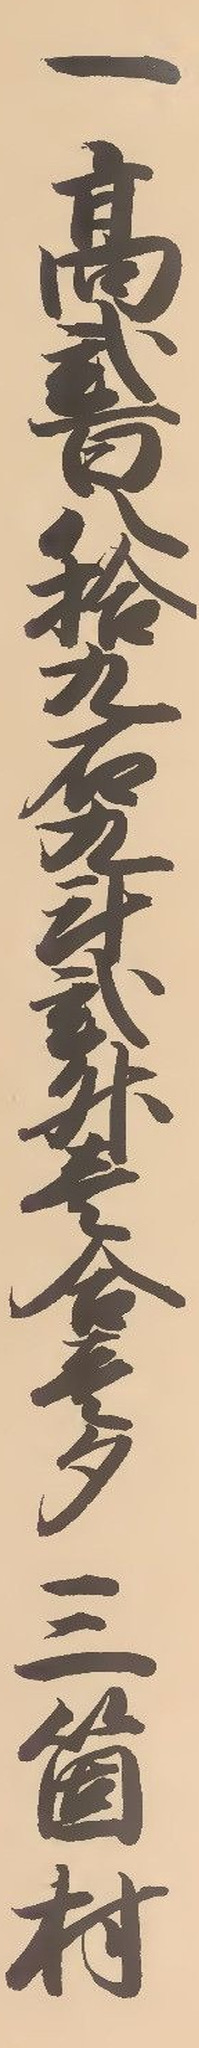一高弐百八拾九石九斗弐升壱合壱勺三箇村
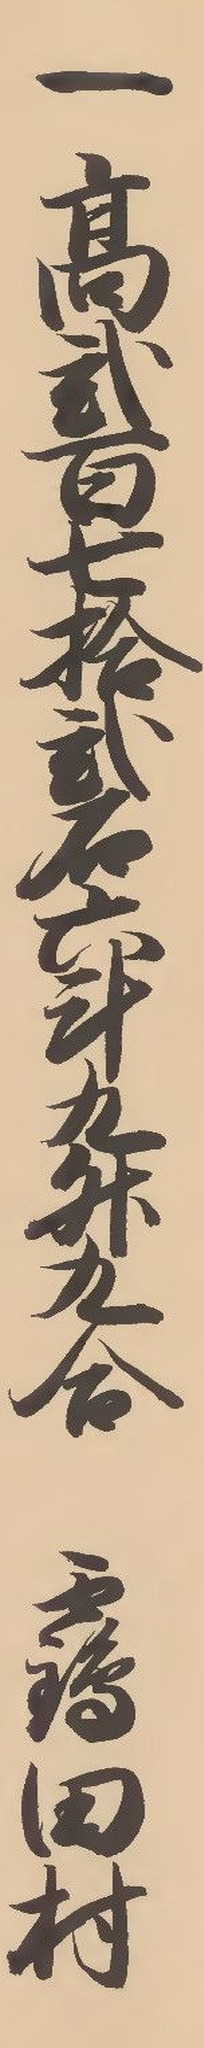一高弐百七拾弐石六斗九升九合鶴田村
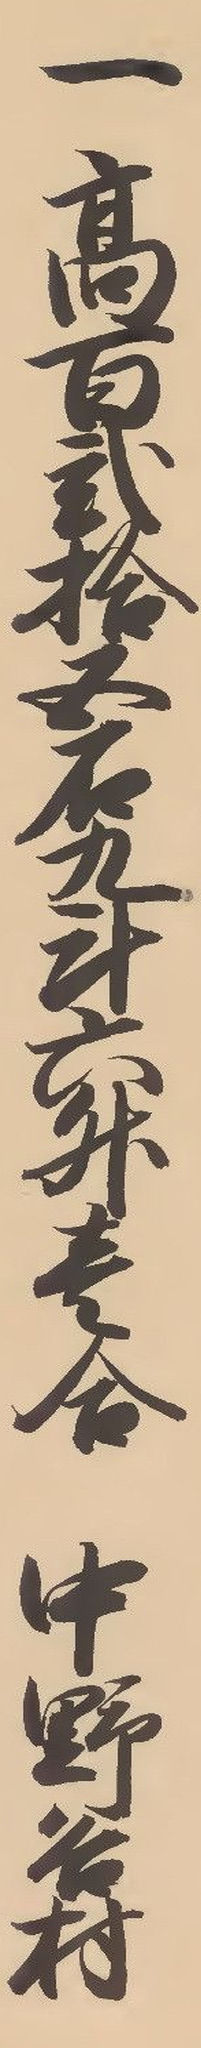一高百弐拾五石九斗六升壱合中野谷村
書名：常陸国郷帳
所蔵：国立公文書館 National Archives of Japan
